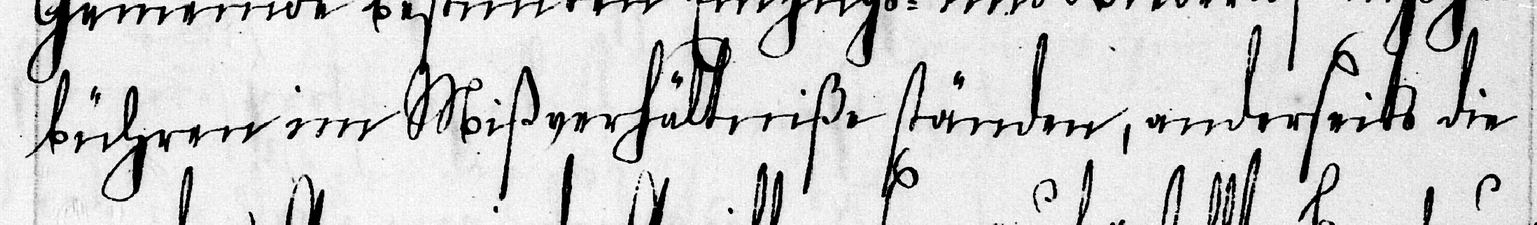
bühren im Mißverhältniße ständen, anderseits die
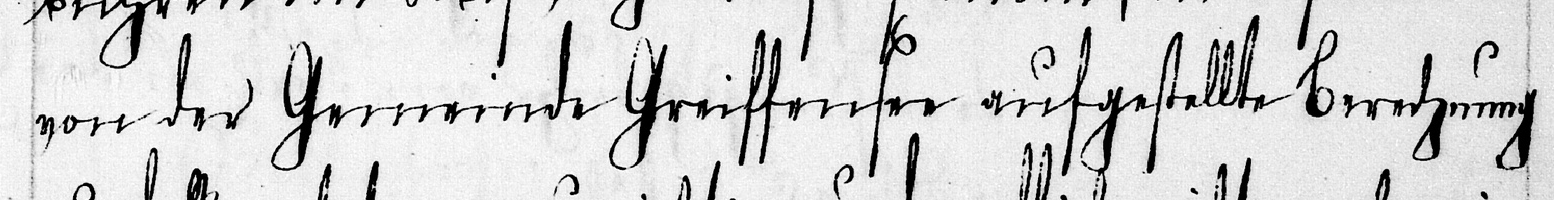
von der Gemeinde Greiffensee aufgestellte Berechnung
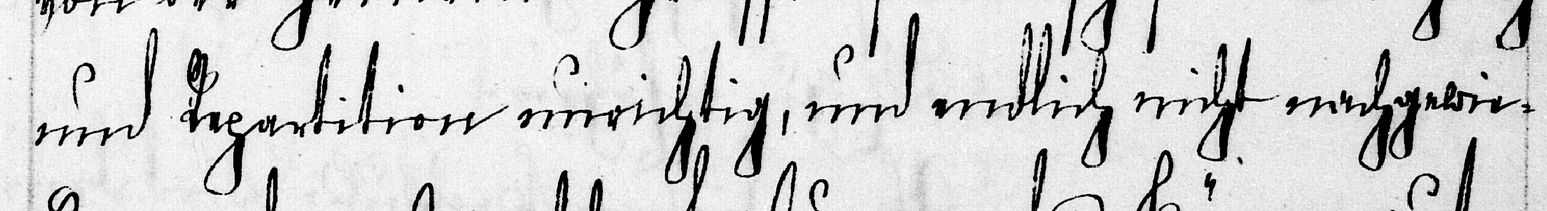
und Repartition unrichtig, und endlich nicht nachgewie¬
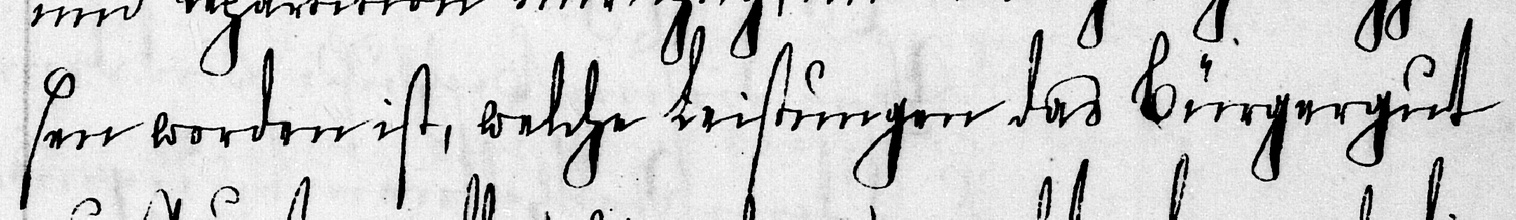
sen worden ist, welche Leistungen das Bürgergut
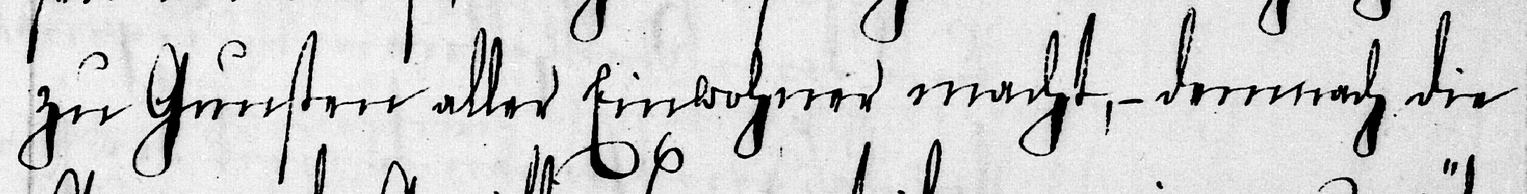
zu Gunsten aller Einwohner macht, – demnach die
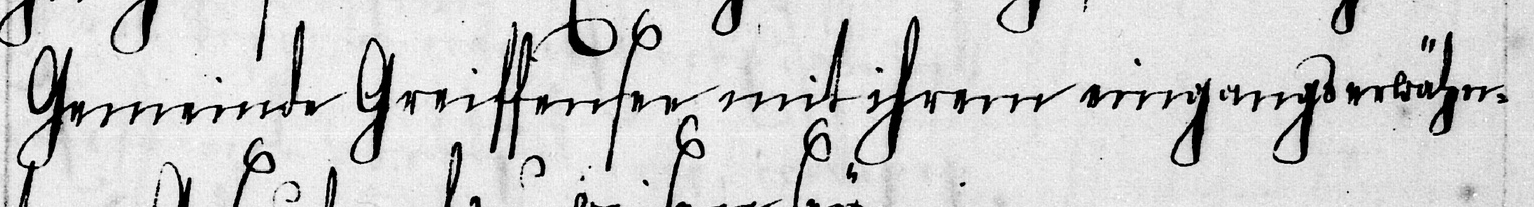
Gemeinde Greiffensee mit ihrem eingangserwähn¬
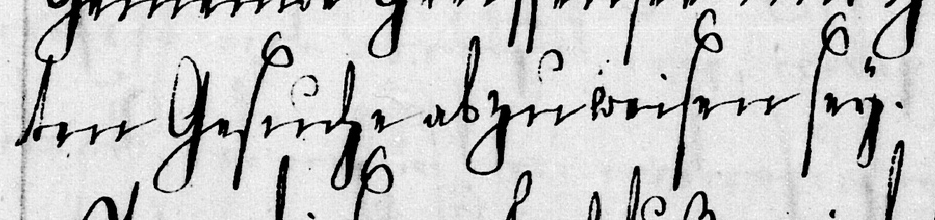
ten Gesuche abzuweisen sey.
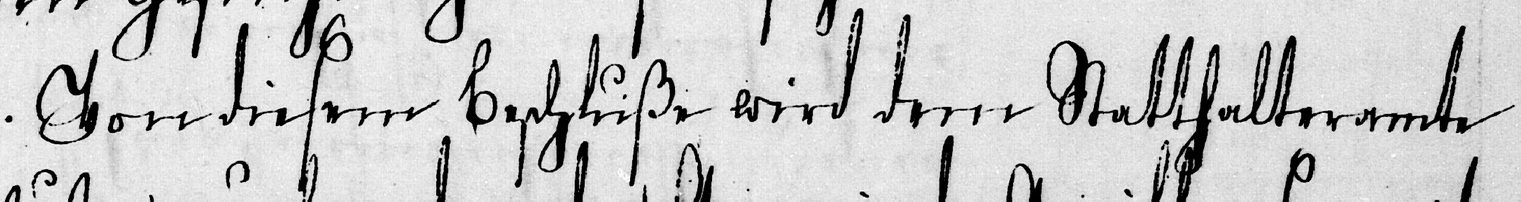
Von diesem Beschluße wird dem Statthalteramte
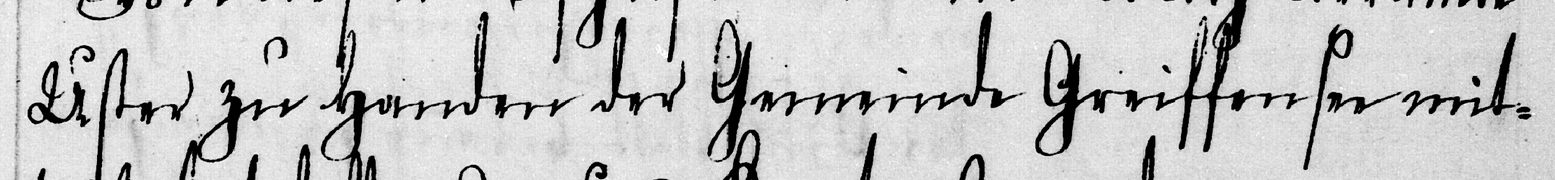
Uster zu Handen der Gemeinde Greiffensee mit¬
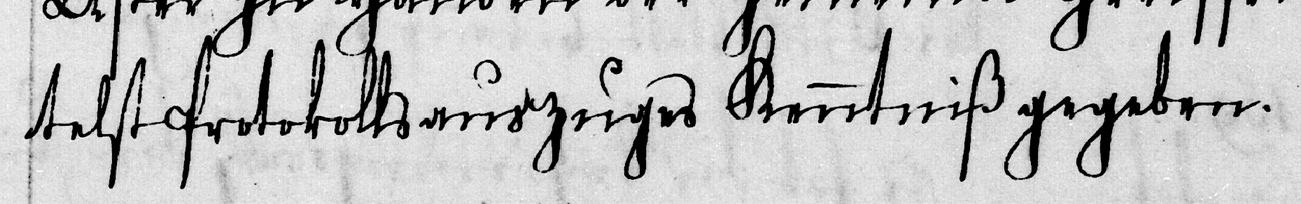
telst Protokollsauszuges Kenntniß gegeben.
